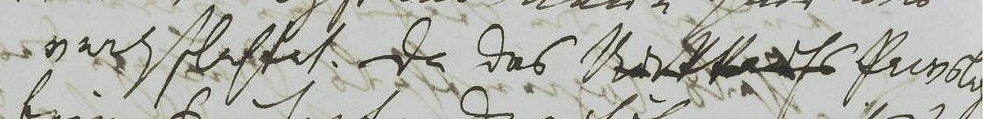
verpflichtet. Da das Rückkaufs Privilegium
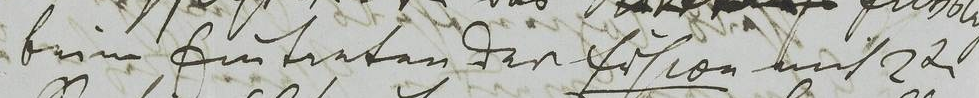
beim Eintreten der Fusion mit 2te
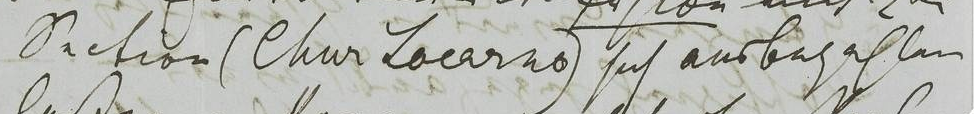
Section (ChurLocarno) sich ausbezahlen
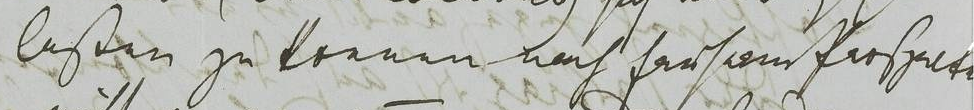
laßen zu können nach früherm Prospectus
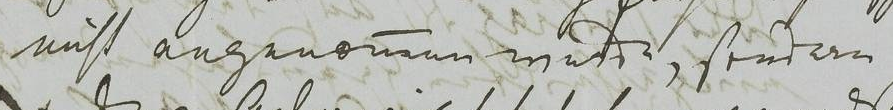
nicht angenommen wurde, sondern
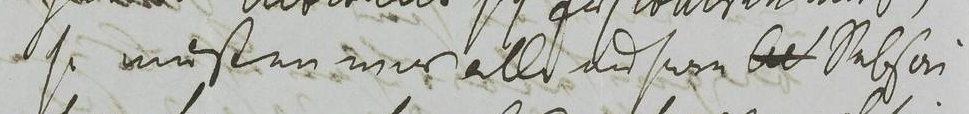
so müßen wir alle unsere Subscri-
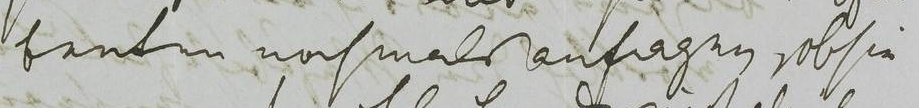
benten nochmals anfragen, ob sie
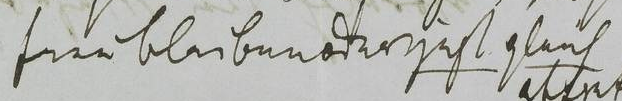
treu bleiben oder jezt gleich
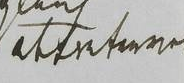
abtreten wollen.
